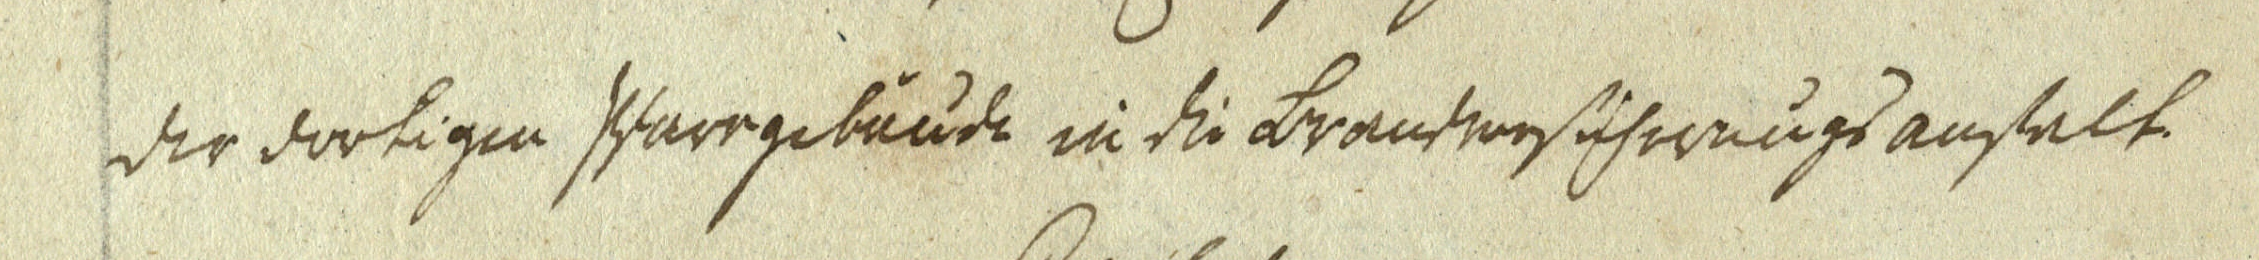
der dortigen Parrgebäude in die Brandversicherungsanstalt.
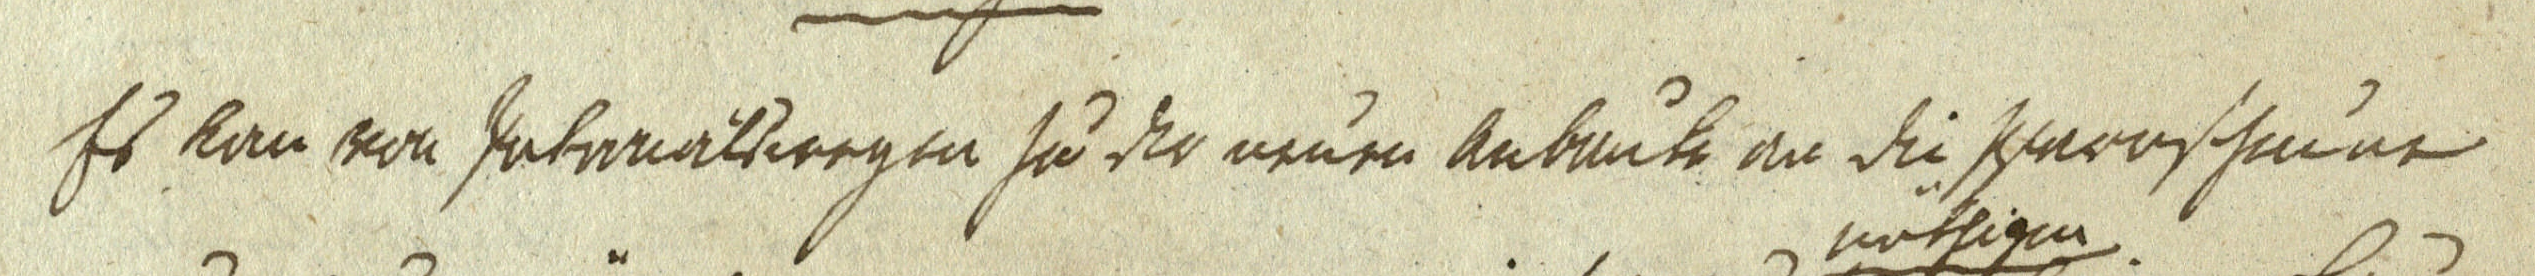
Es kan von Patronatswegen zu der neuen Anbaute an die Pfarrscheune
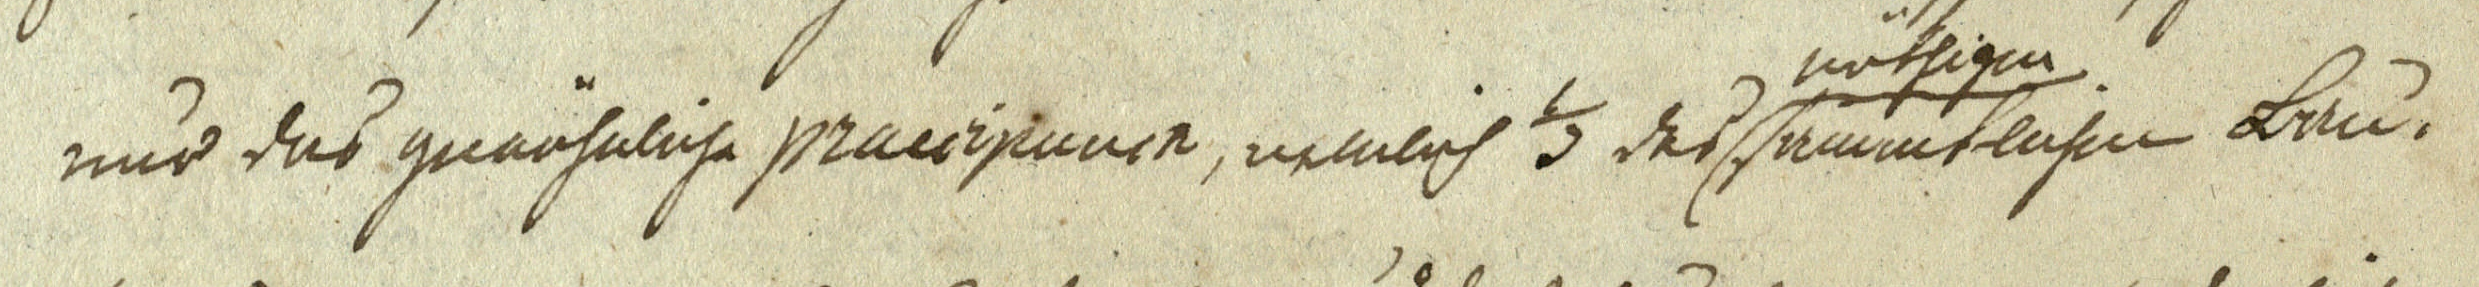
und das gewöhnliche praecipium, nemlich 1/3 des nöthigen sämmtlichen Bau¬
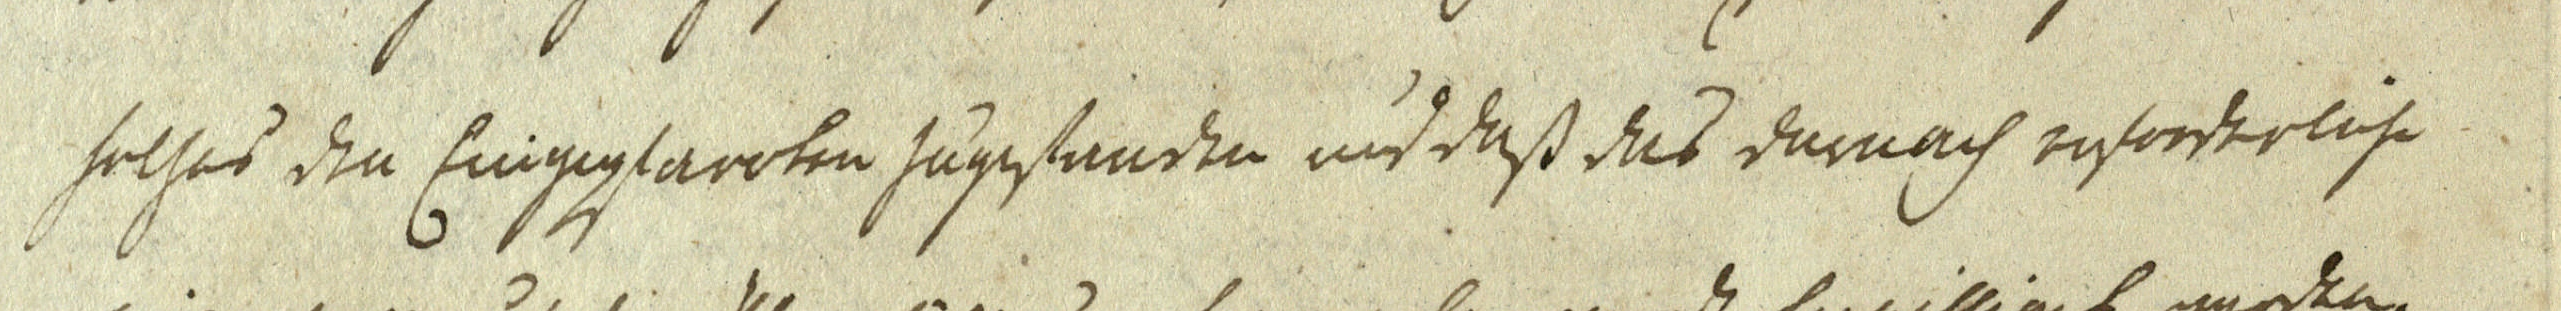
holzes den Eingepfarrten zugestanden und daß das darnach erforderliche
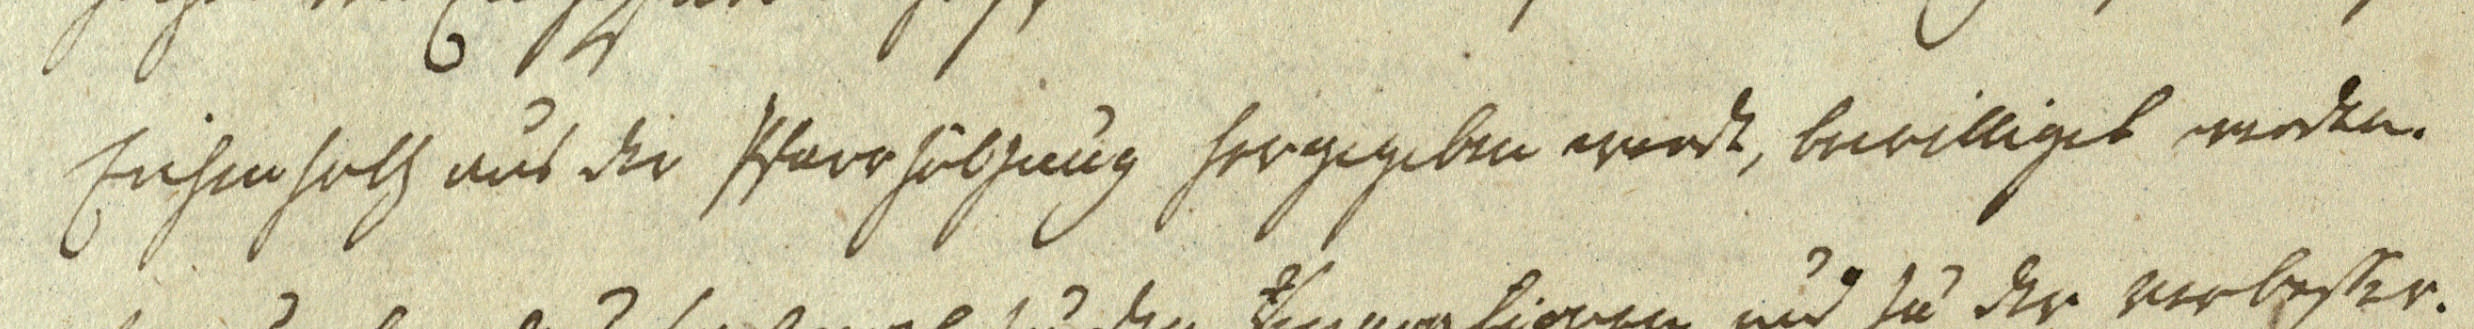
Eichenholz aus der Pfarrhölzung hergegeben würde, bewilliget werden.
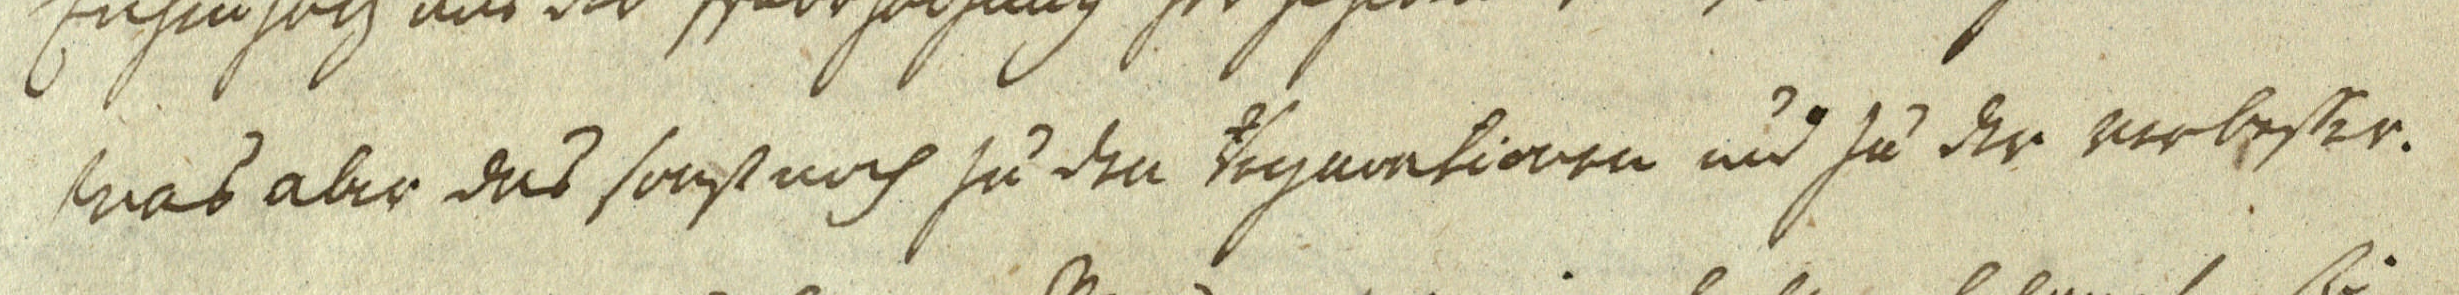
Was aber das sonst noch zu den Reparationen und zu der verbesser¬
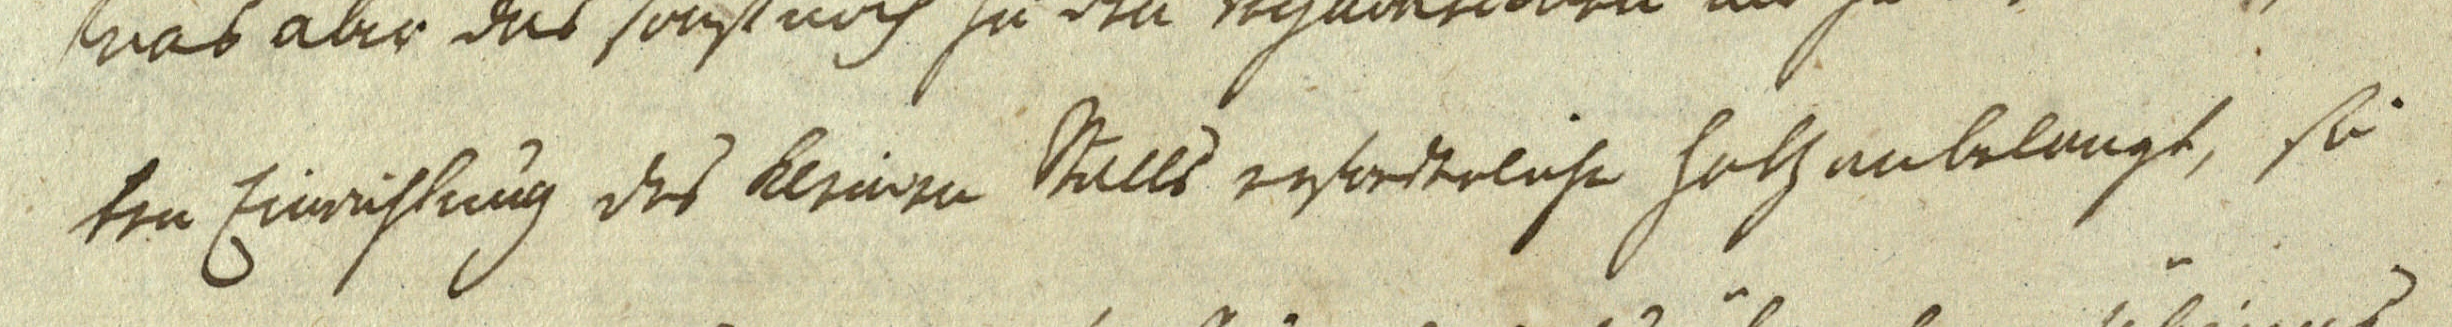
ten Einrichtung des kleinen Stalls erforderliche Holz anbelangt, so
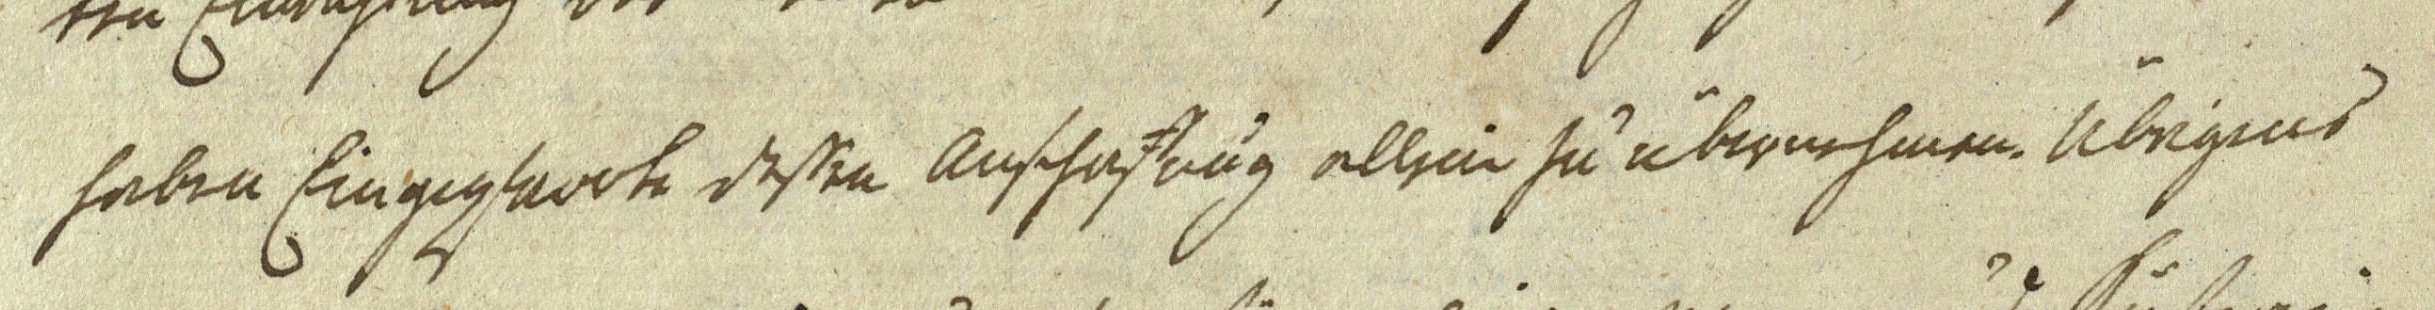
haben Eingepfarrte dessen Anschaffung allen zu übernehmen. Übrigens
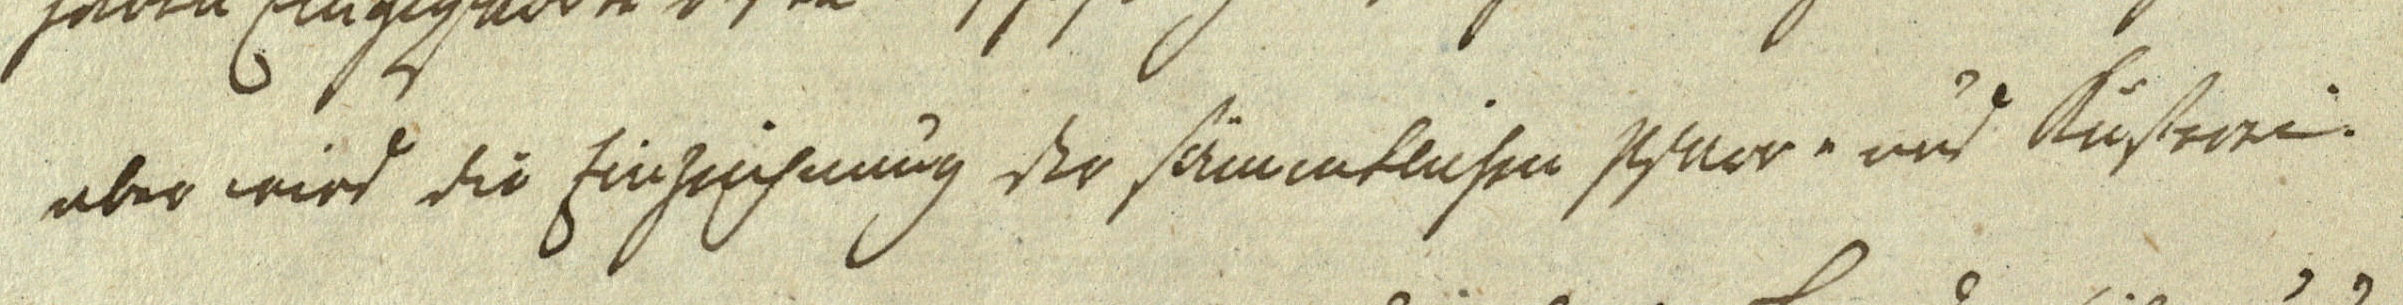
aber wird die Einzeichnung der sämmtlichen Pfarr- und Küsterei¬
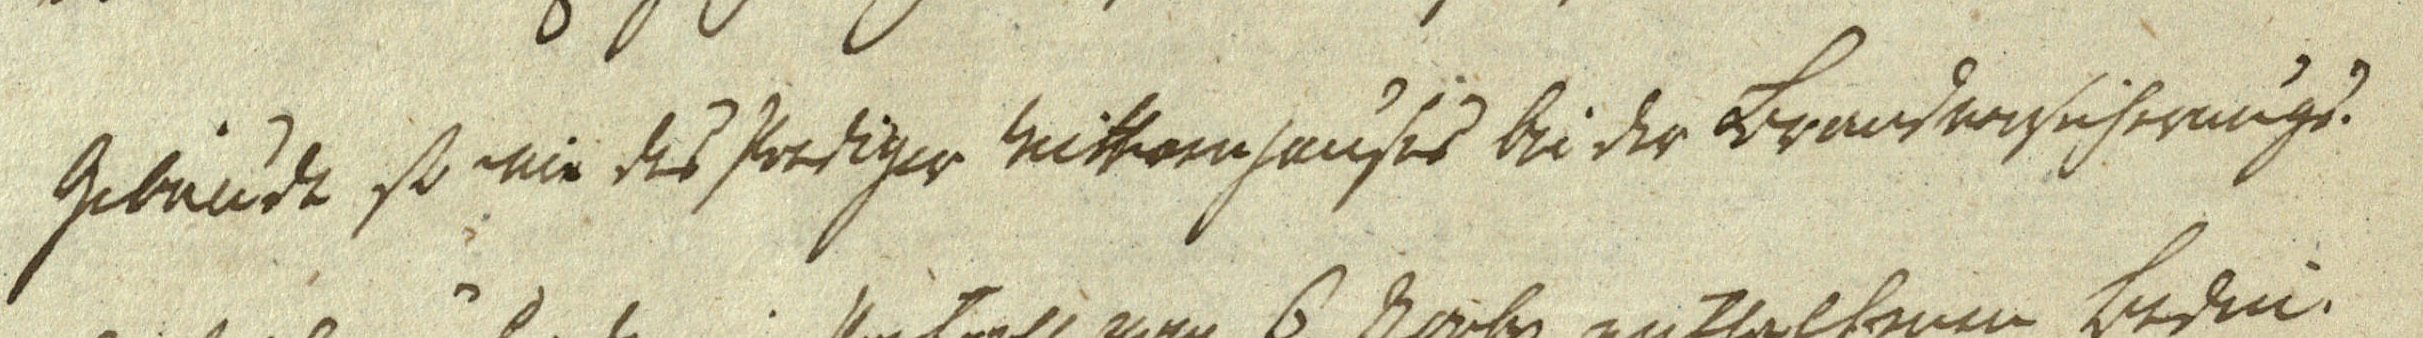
Gebäude so wie des Prediger Wittwenhauses bei der Brandversicherungs¬
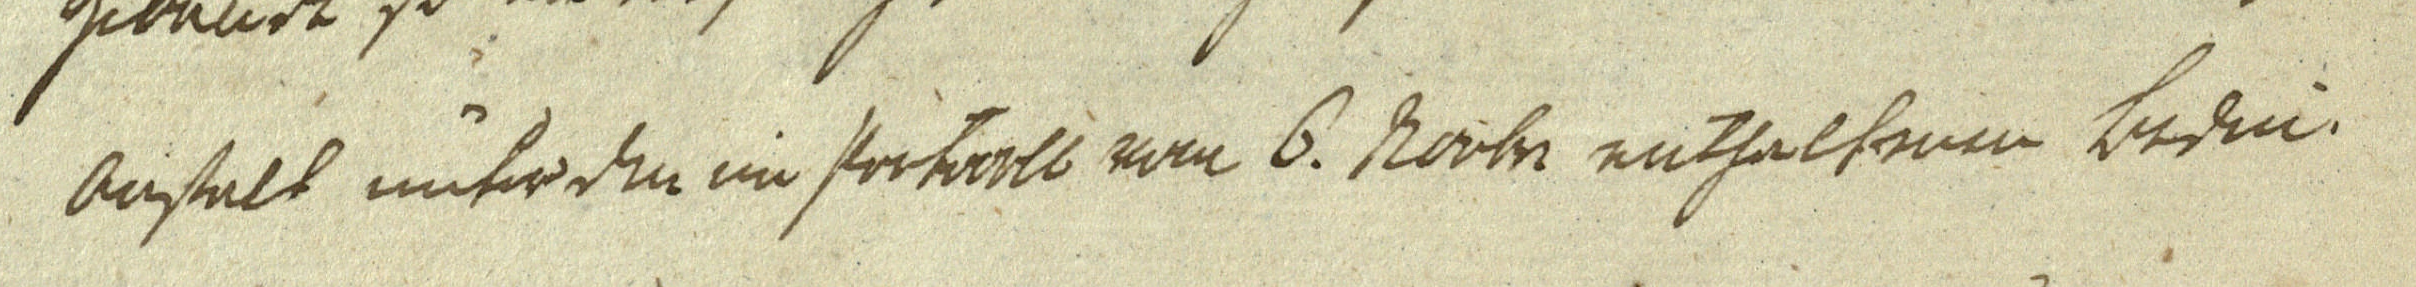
anstalt unter den in Protocoll vom 6. Novbr enthaltenen Bedin¬
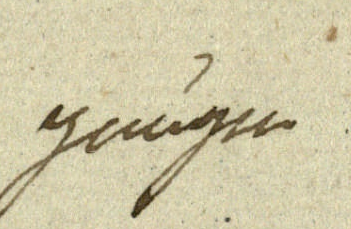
gungen
